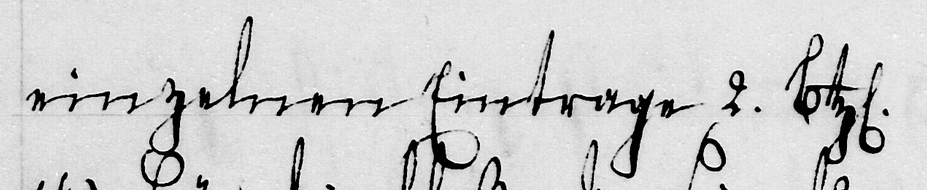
einzelnen Eintrage 2. Btz[e¬
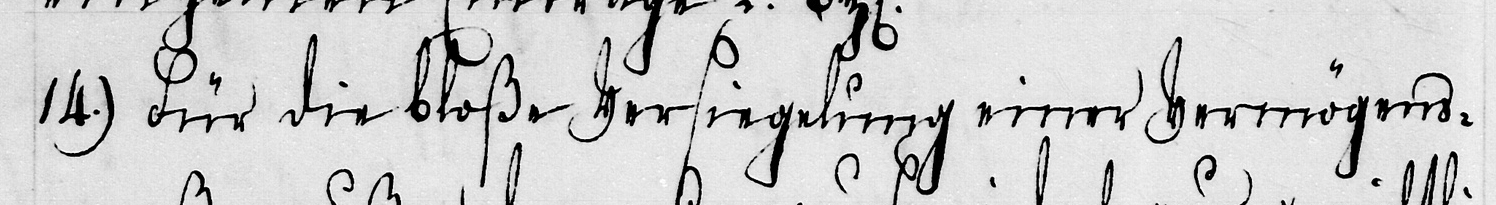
14.) Für die bloße Versiegelung einer Vermögens¬
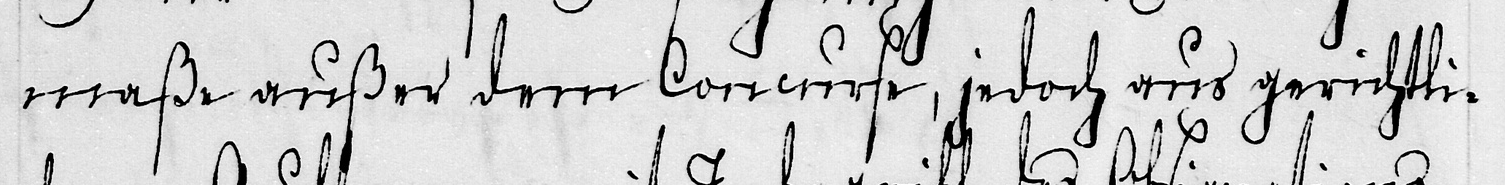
maße außer dem Concurse, jedoch aus gerichtli¬
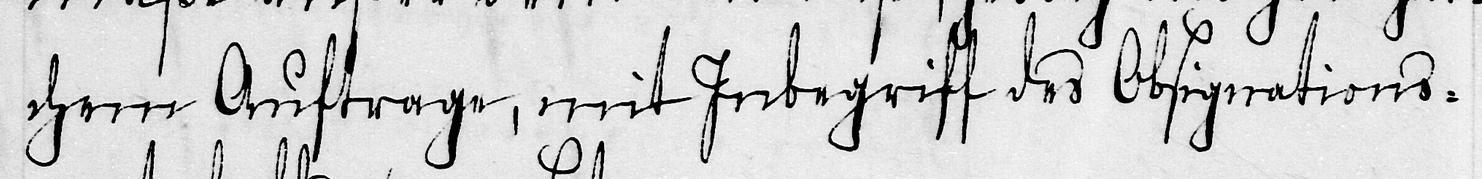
chem Auftrage, mit Inbegriff des Obsignations¬
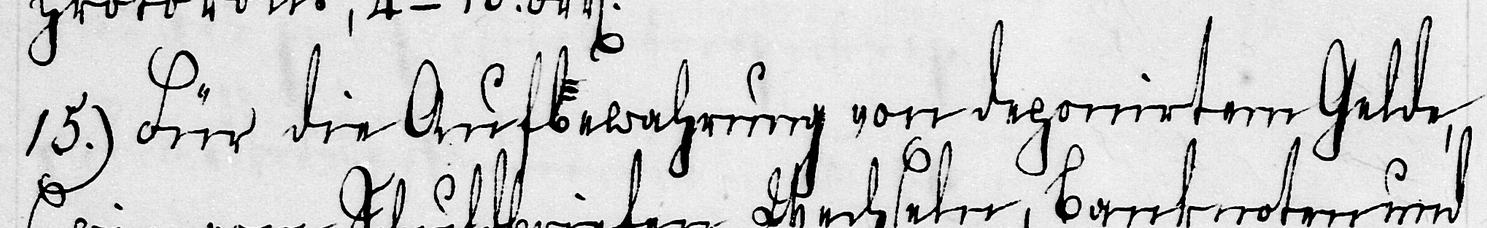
15.) Für die Aufbewahrung von deponirtem Gelde,
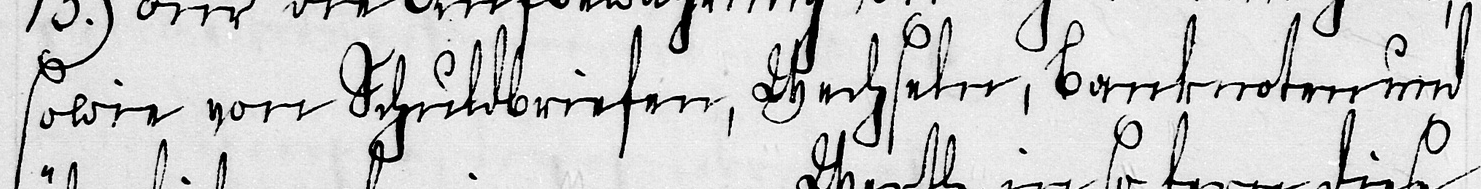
sowie von Schuldbriefen, Wechseln, Banknoten und
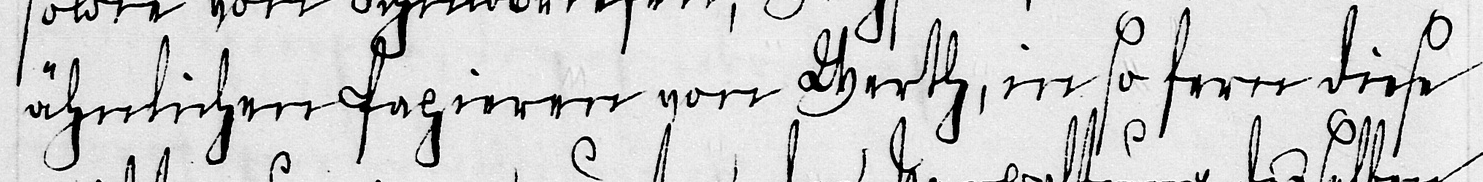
ähnlichen Papieren von Werth, in so fern diese
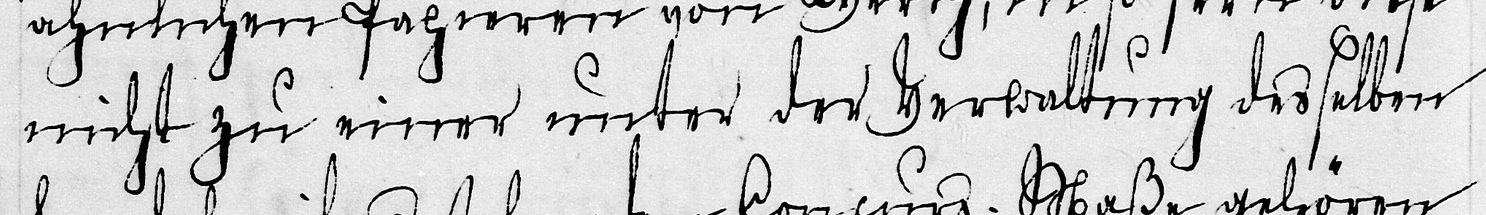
nicht zu einer unter der Verwaltung desselben
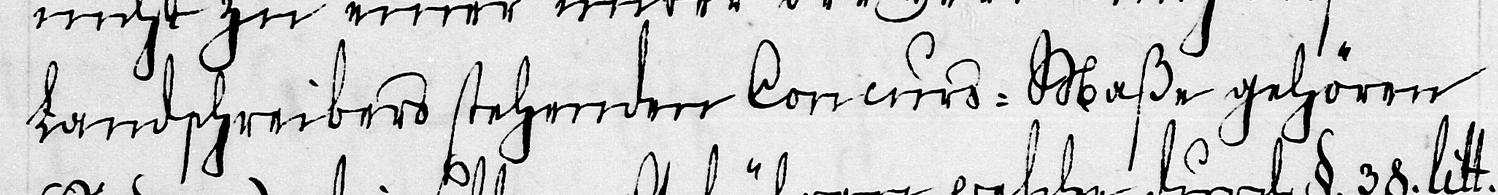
Landschreibers stehenden Concurs-Maße gehören
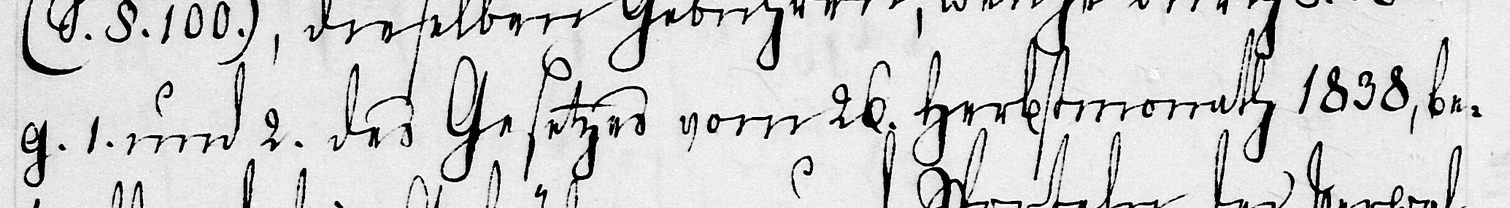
g. 1. und 2. des Gesetzes vom 26. Herbstmonath 1838, be¬
